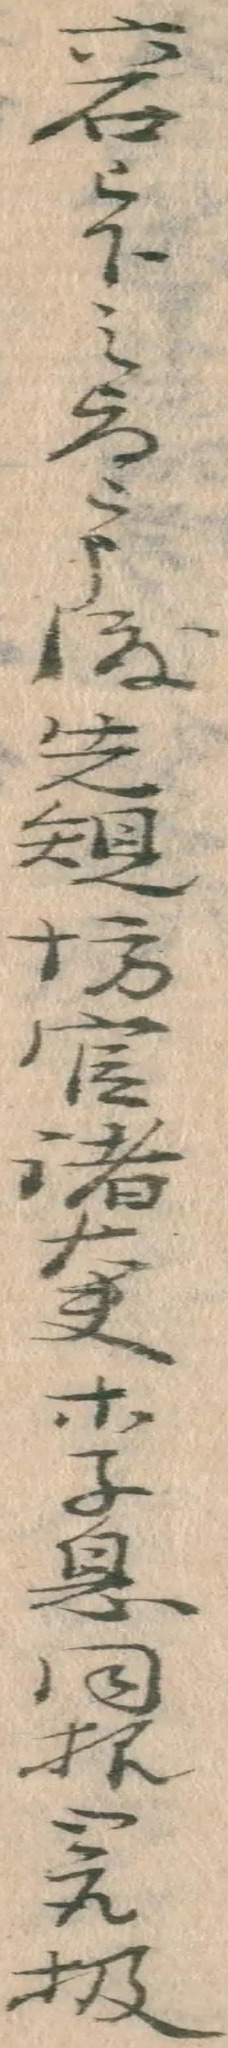六石被下之旨被申渡先規坊官諸大夫等子息同様御取扱
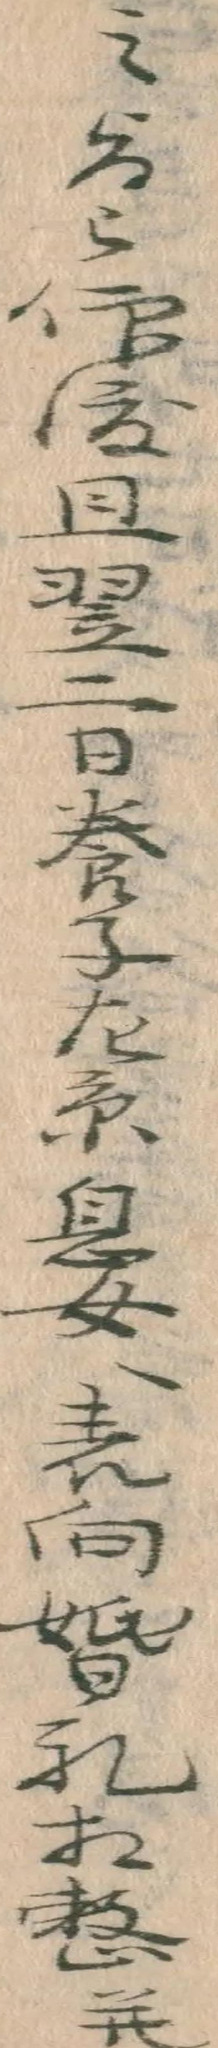之旨被仰渡且翌二日養子左京息女へ表向婚礼相整并
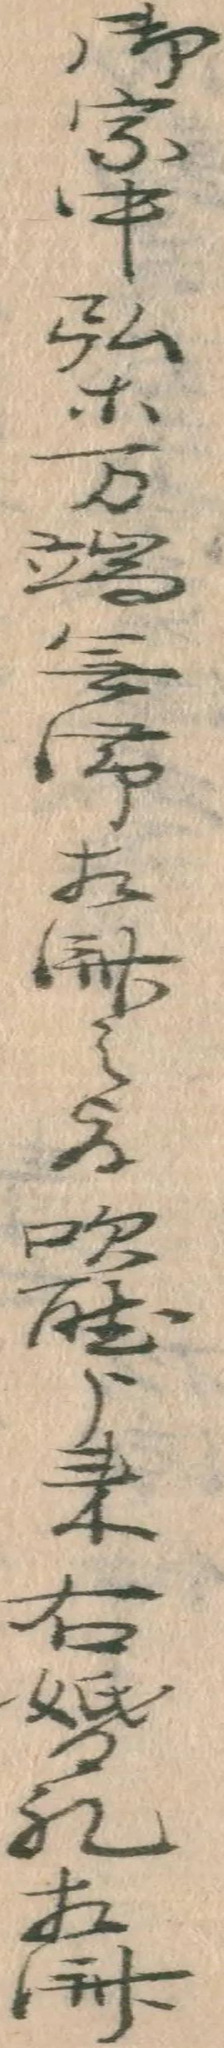御家中弘等万端無滞相済之旨吹聴申来右婚礼相済
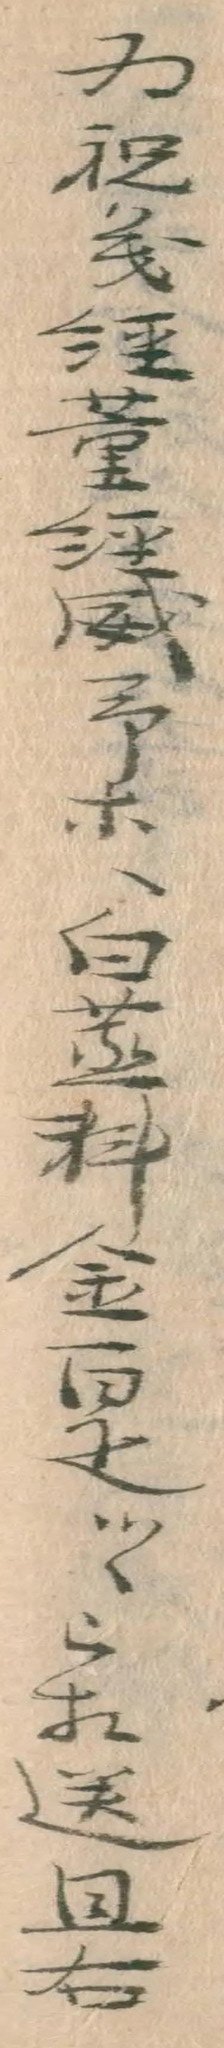為祝義経董経威予等へ白蒸料金百疋ツヽ被相送且右
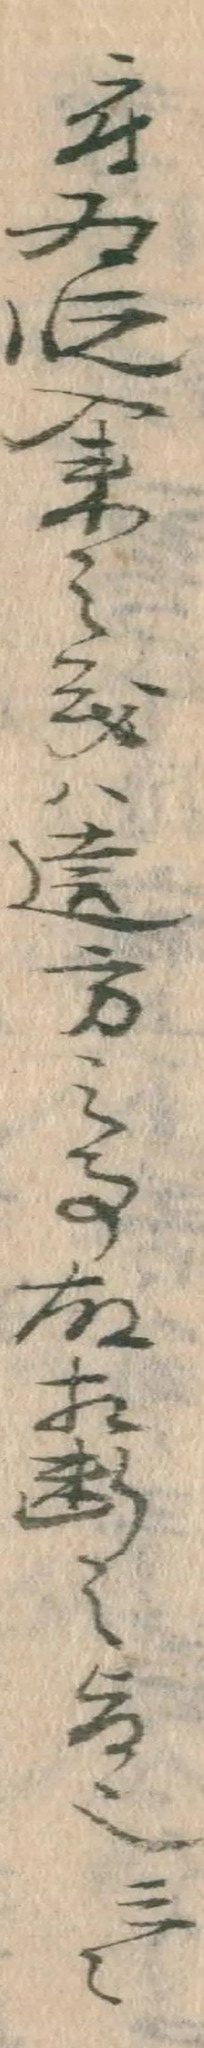ニ付為祝入来之義ハ遠方之事故相断之旨也云々
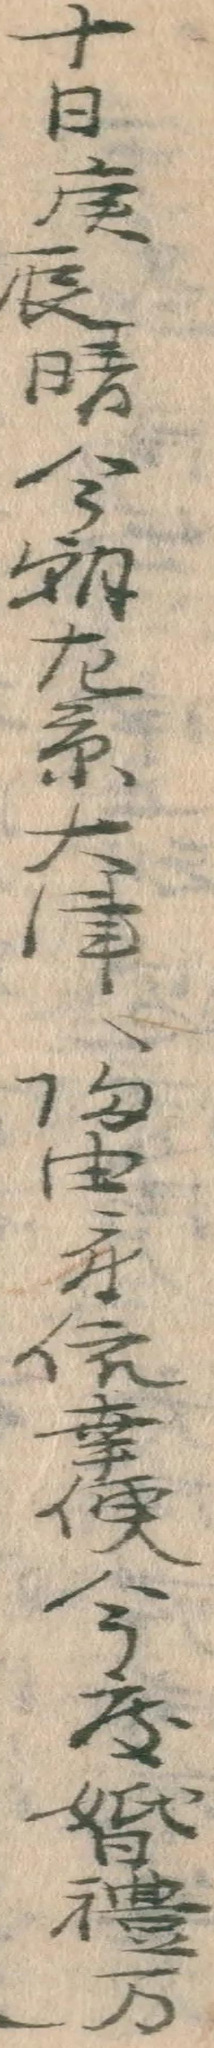十日庚辰晴今朝左京大津へ帰由ニ付依幸便今度婚禮方
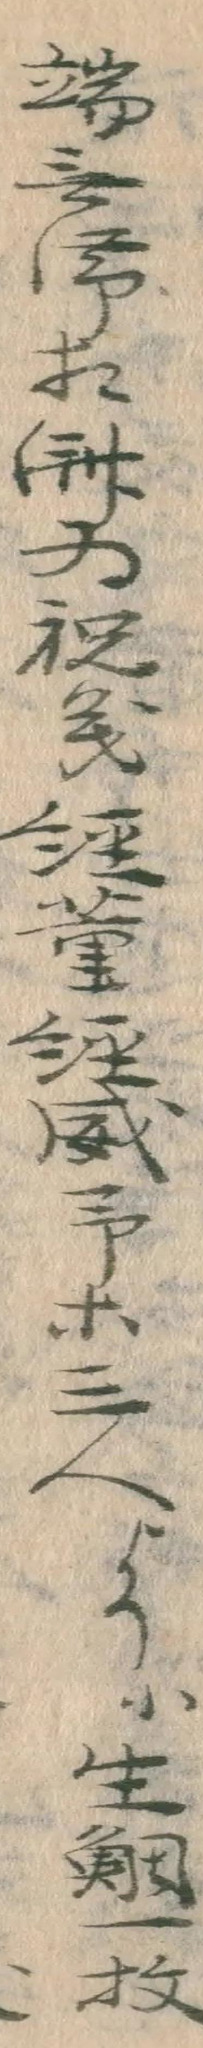端無滞相済為祝義経董経威予等三人より小生鯛一枚
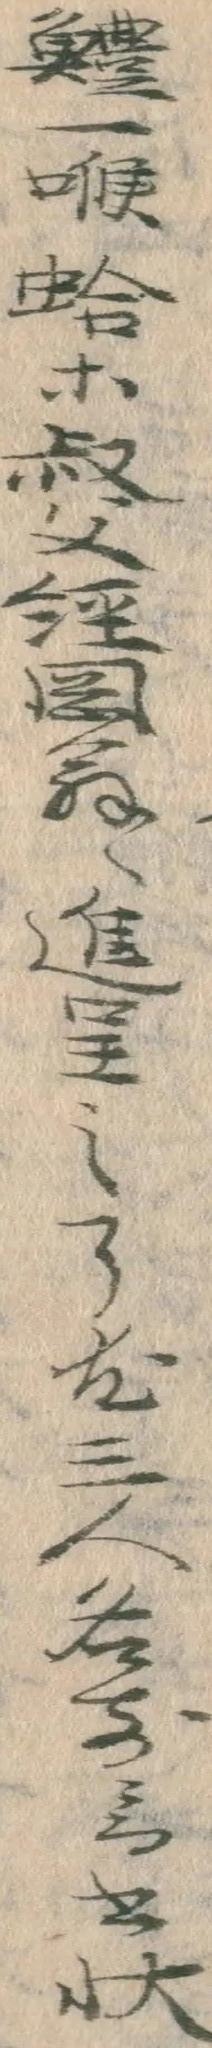鱧一喉蛤等叔父経岡翁へ進呈之了尤三人名前ニ而書状
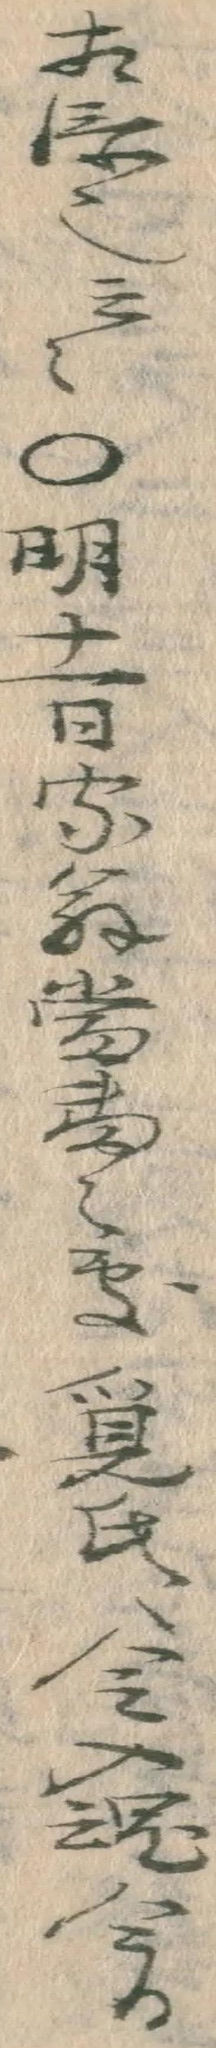相添也云〻○明十一日家翁當番之處筧氏へ令入魂今日
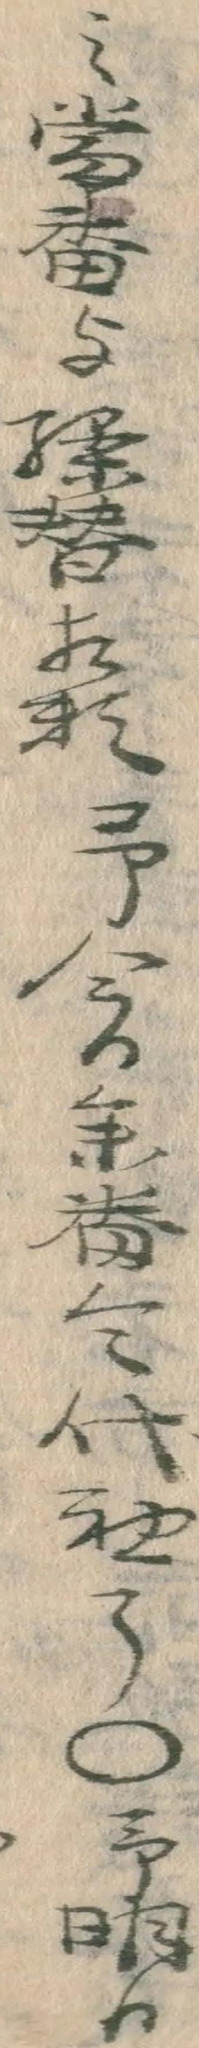之當番と繰替相頼予今日参番令代勤了○予明日
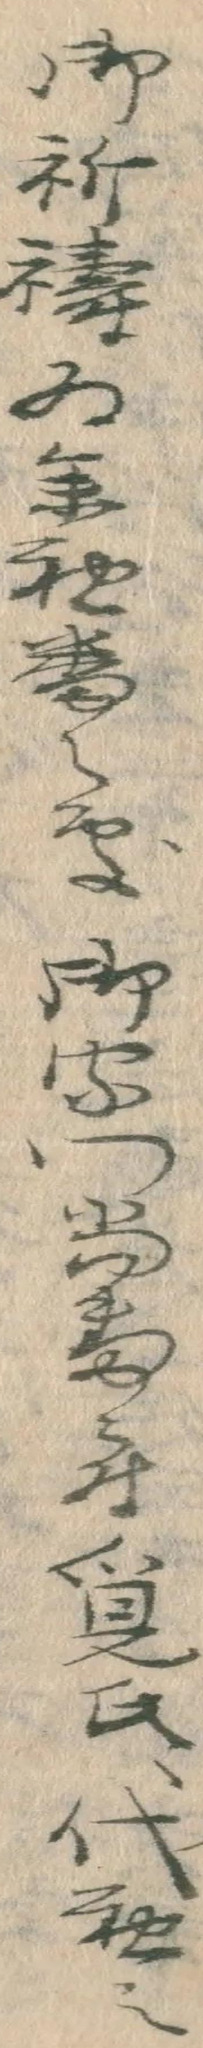御祈祷為参勤番之處御家門當番ニ付筧氏代勤之
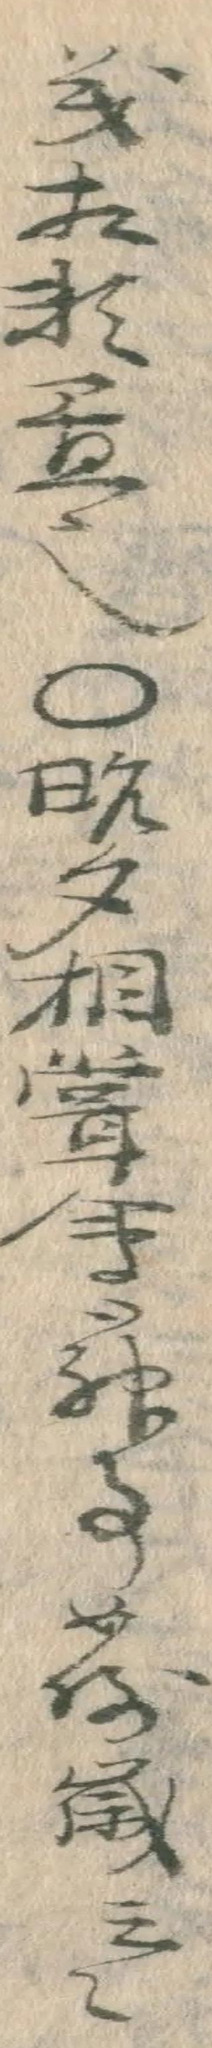義相頼置也○昨夕相嘗會御神事如例歳云々
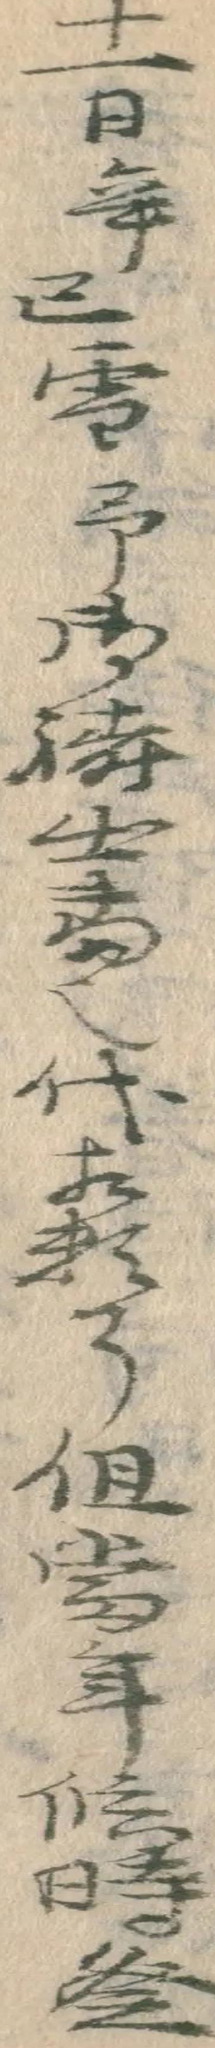十一日辛巳雪予御祷出番之代相頼了但當年臨時祭
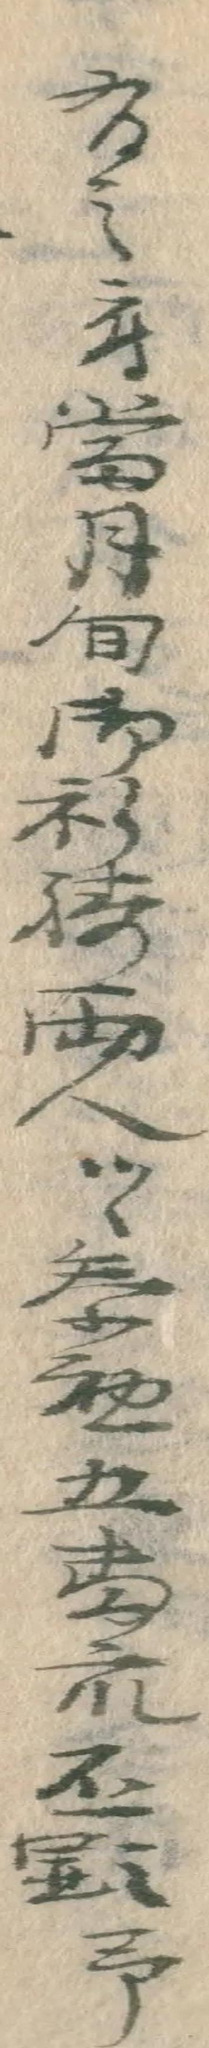有之ニ付當月旬御祈祷両人ツヽ参勤五番衆丕顕予
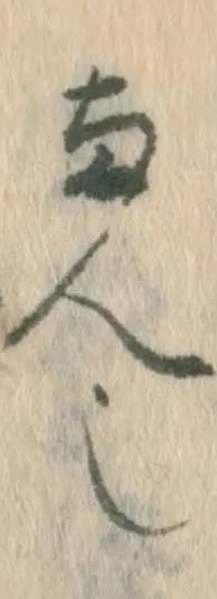両人也
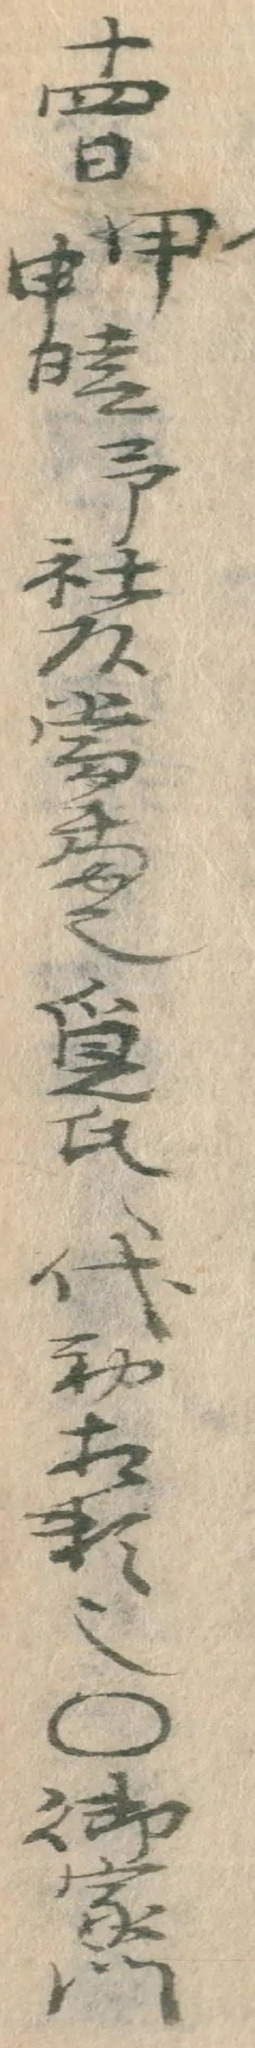十四日甲寅予社頭當番也筧氏へ代初相頼也〇御家門
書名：賀茂社記録. 第63冊
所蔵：国立国会図書館 National Diet Library, JAPAN
